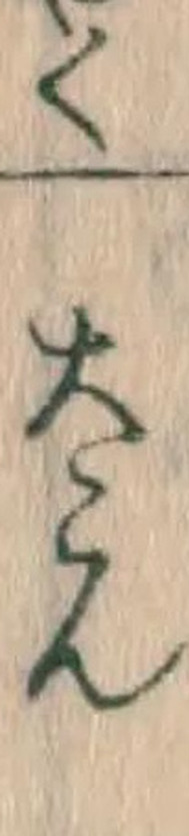大こん
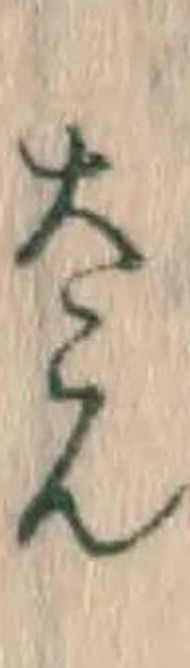大こん
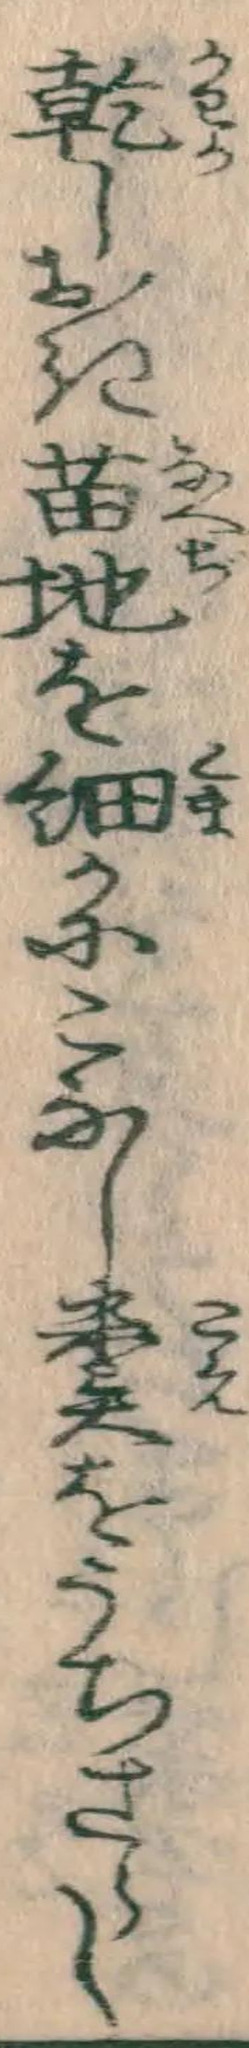乾しおき苗地を細かにこなし糞をうちさらし
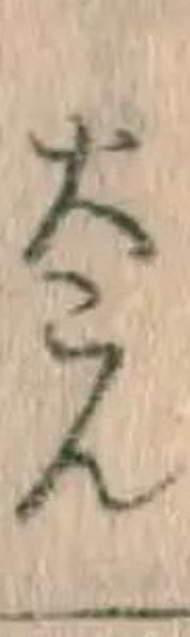大こん
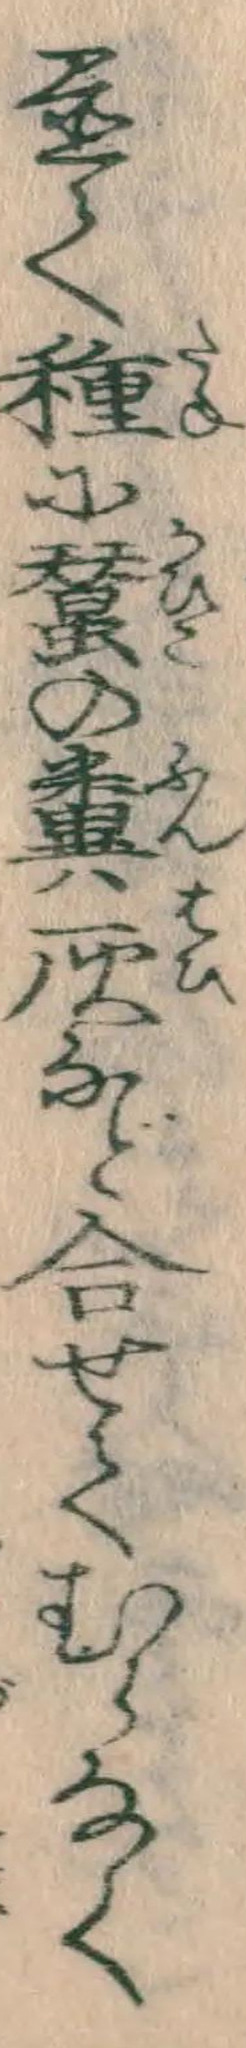置て種に蚕の糞灰など合せてむらなく
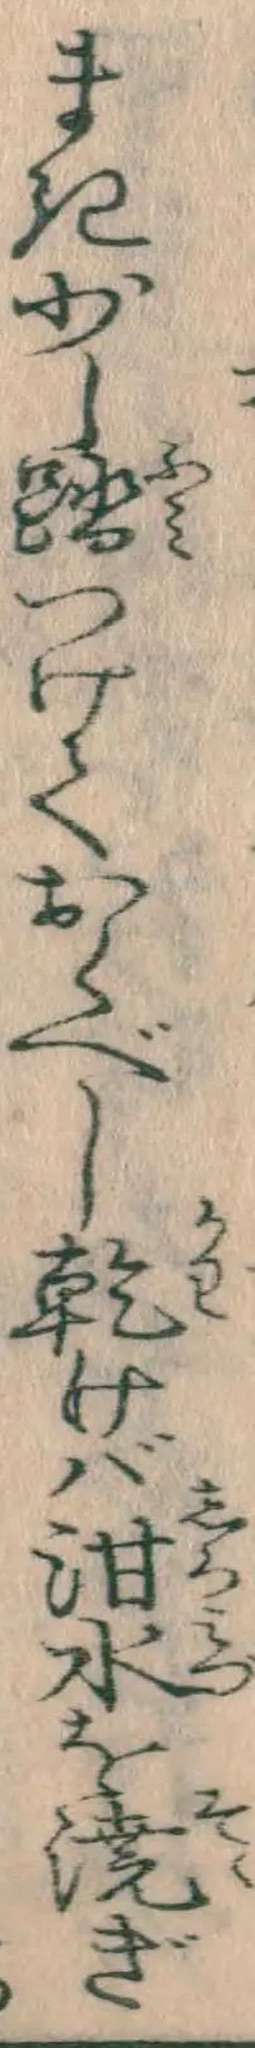まき少し踏つけておくべし乾けば泔水を澆ぎ
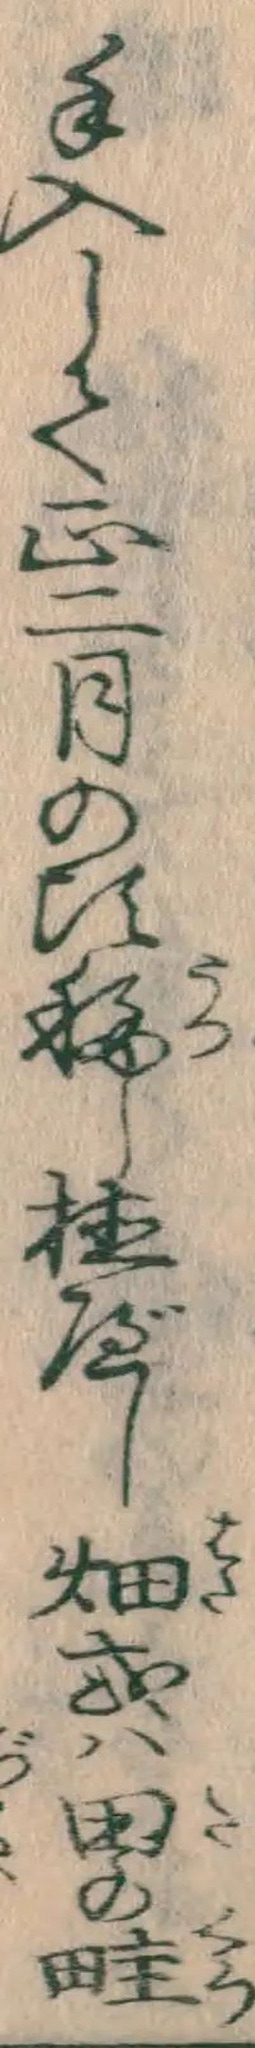手入して正二月の頃移し植べし畑或は田の畦
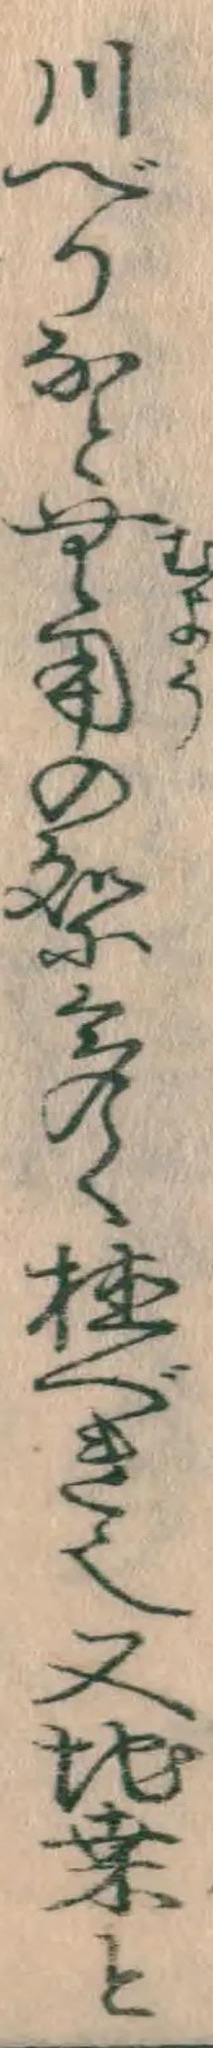川べりなと無用の処に多く植べき也又地桑と
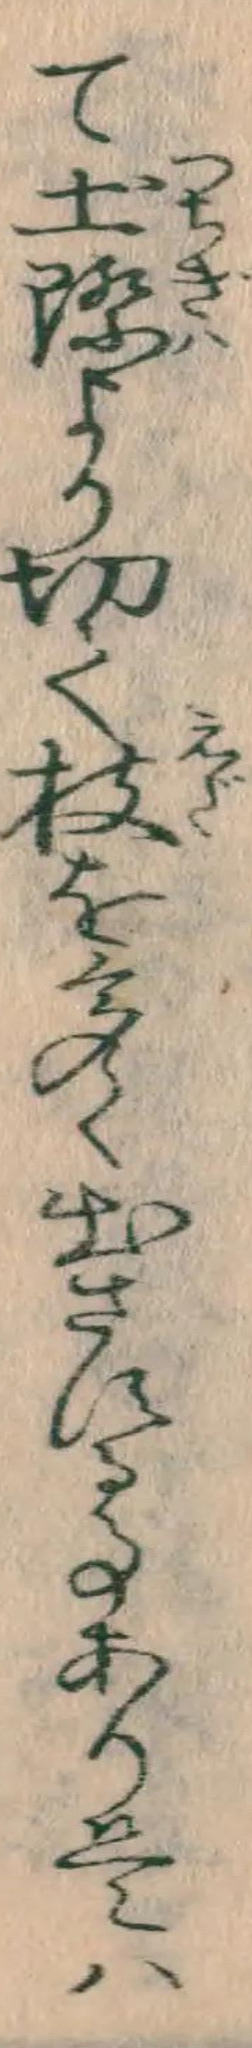て土際より切て枝を多く出さする事あり是は
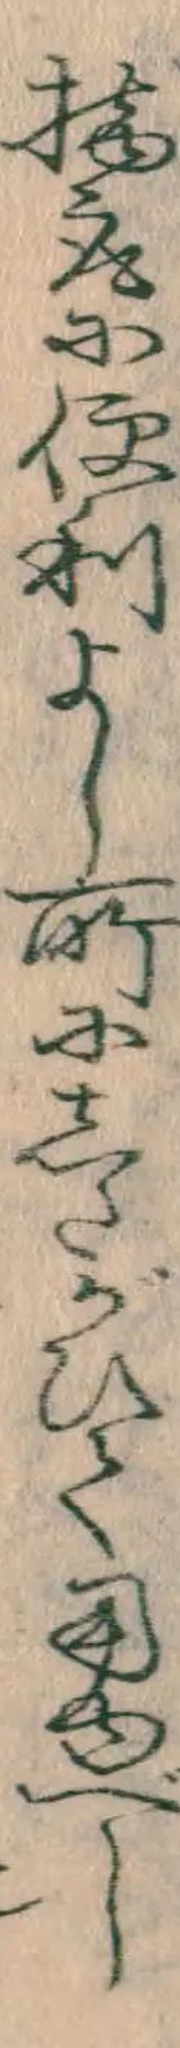摘取に便利よし所にしたがひて用ゆべし
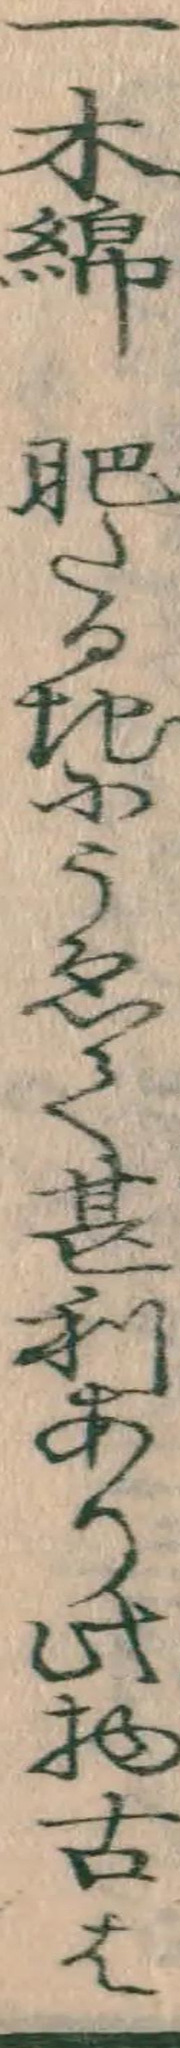一木綿肥たる地にうゑて甚利あり此物古は
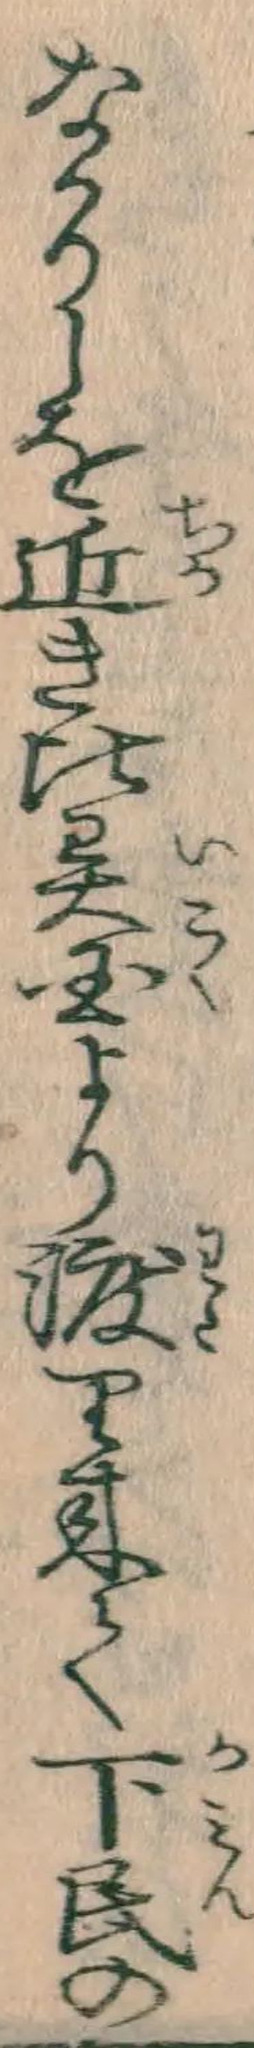なかりしを近き比異国より渡り来て下民の
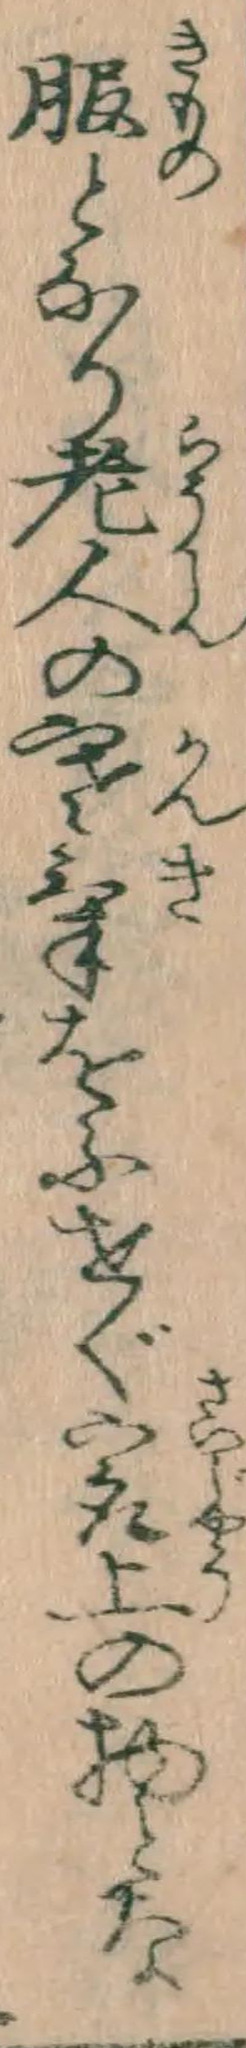服となり老人の寒気をふせぐ最上の物とな
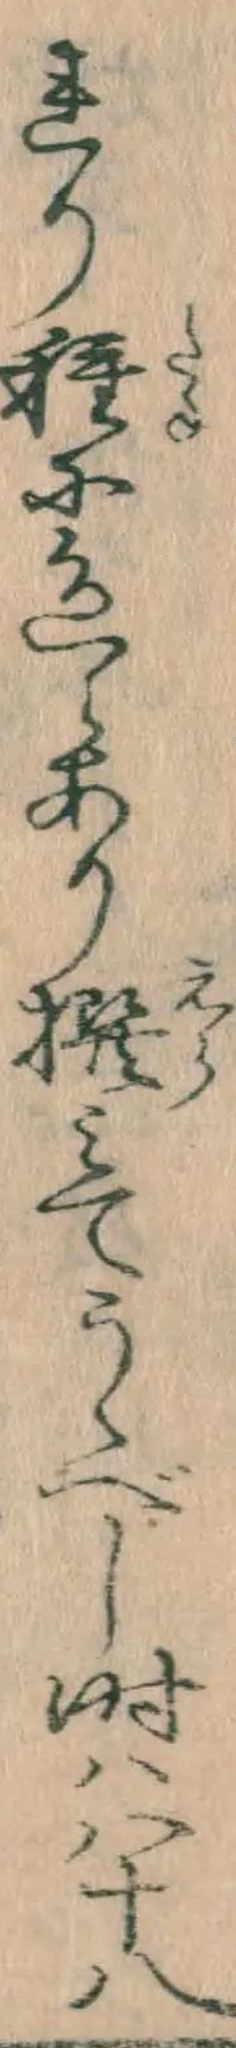れり種に色々あり撰みてうゝべし時は八十八
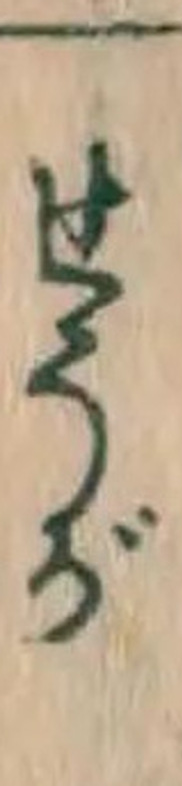せうが
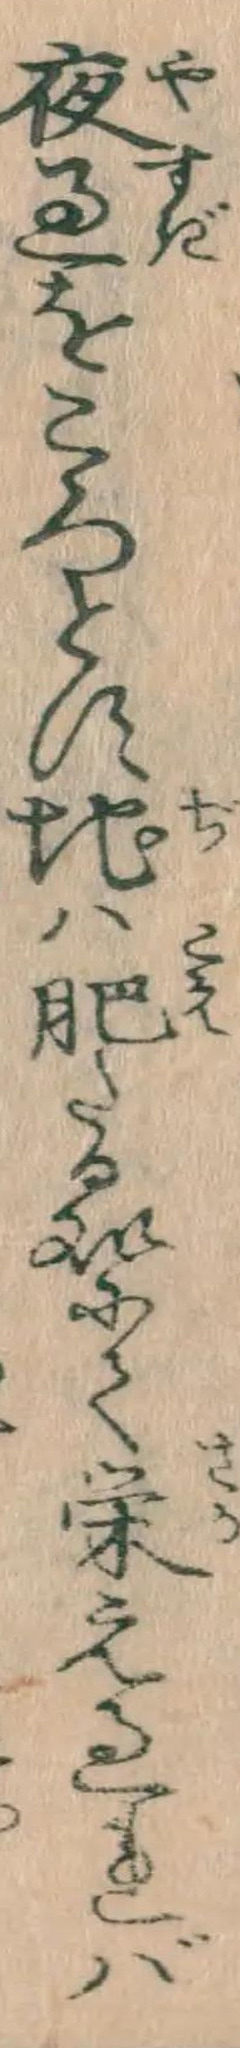夜過をころとす地は肥たる処にて栄え過れば
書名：広益秘事大全 3巻. [5]
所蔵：国立国会図書館 National Diet Library, JAPAN
